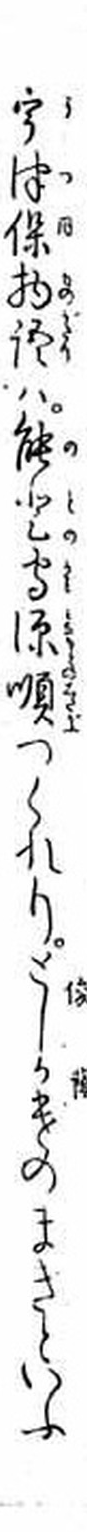宇津保物語は。能登守源順つくれり。としかけのまきといふ
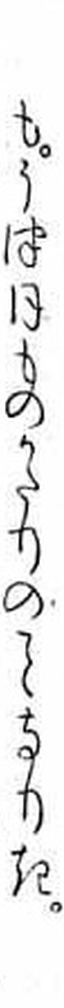も。うつほものかたりのことなりき。
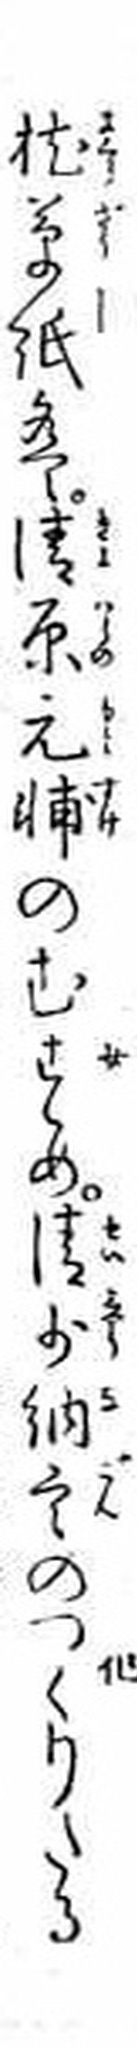枕草紙は。清原元輔のむすめ。清少納言のつくりたる
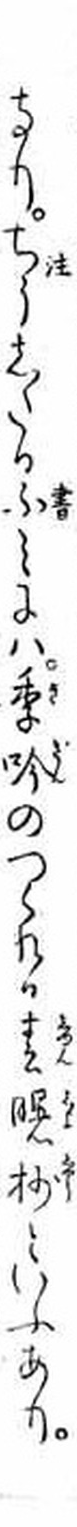なり。ちうしたるふみには。季吟のつくれる春曙抄といふあり。
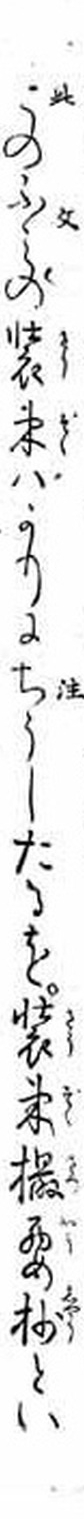このふみの装束ばかりにちうしたるを。装束撮要抄とい
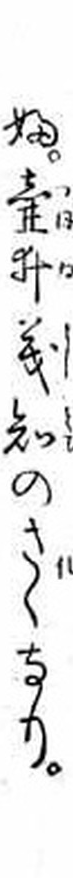ふ。壷井義知のさくなり。
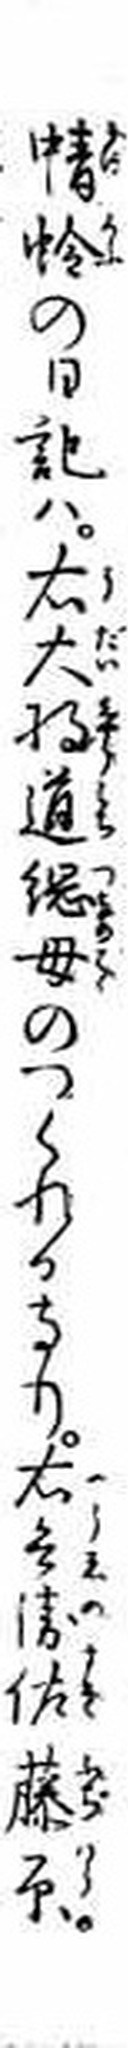蜻蛉の日記は。右大将道綱母のつくれるなり。右兵衛佐藤原。
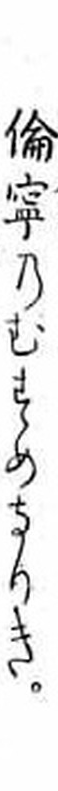倫寧のむすめなりき。
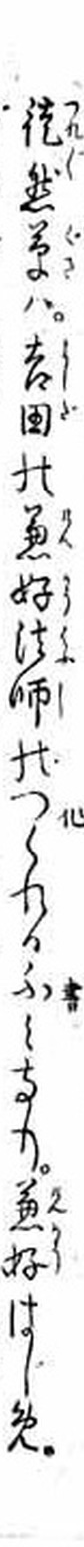徒然草は。吉田の兼好法師のつくれるふみなり。兼好はじめ。
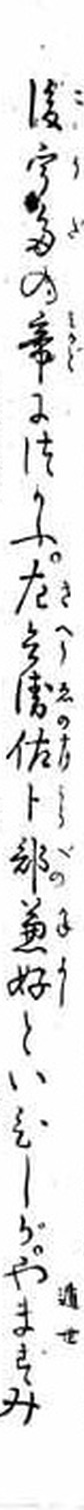後宇多の帝につかふ。左兵衛佐卜部兼好といひしが。やますみ
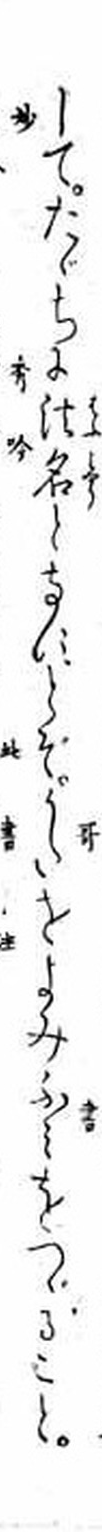して。たゞちに法名となすとぞ。うたをよみふみをつゞること。
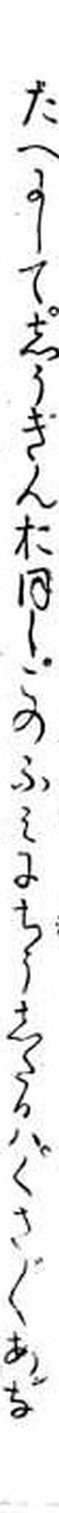たへにして。しうぎんおほし。このふみにちうしたるは。くさ〴〵あな

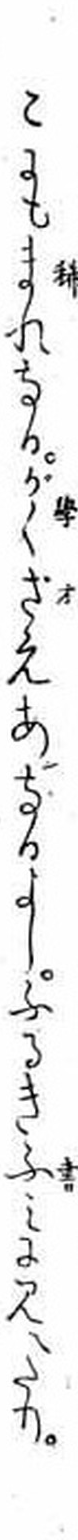こにもまれなる。がくざえあなるよし。ふるきふみに見へたり。
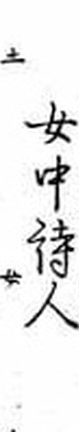女中詩人
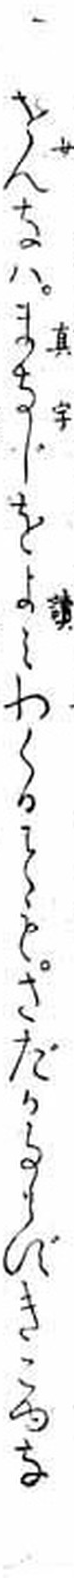をんなは。まなじをよみわくることも。さだかならずきこゆな
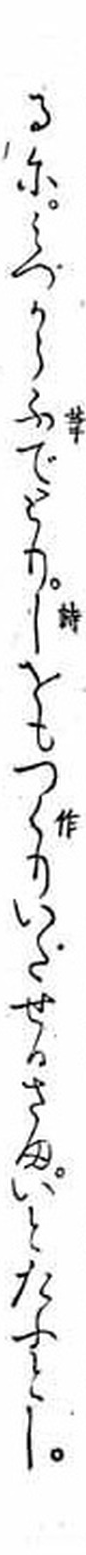るに。みづからふでとり。しをもつくりいだせるさま。いとたふとし。
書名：女学範
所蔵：東京学芸大学教育コンテンツアーカイブ
